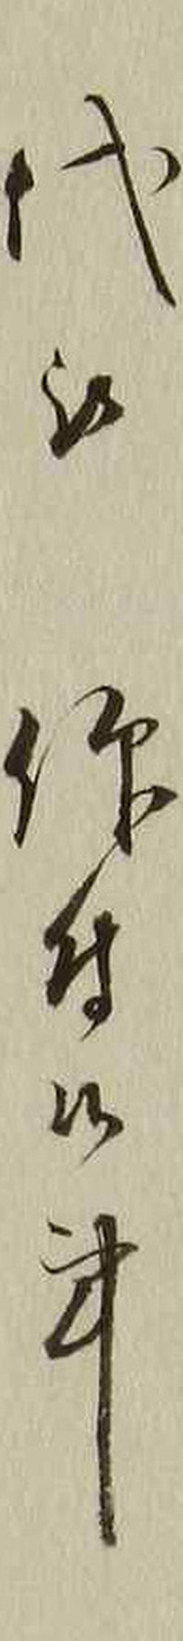代被仰付候事
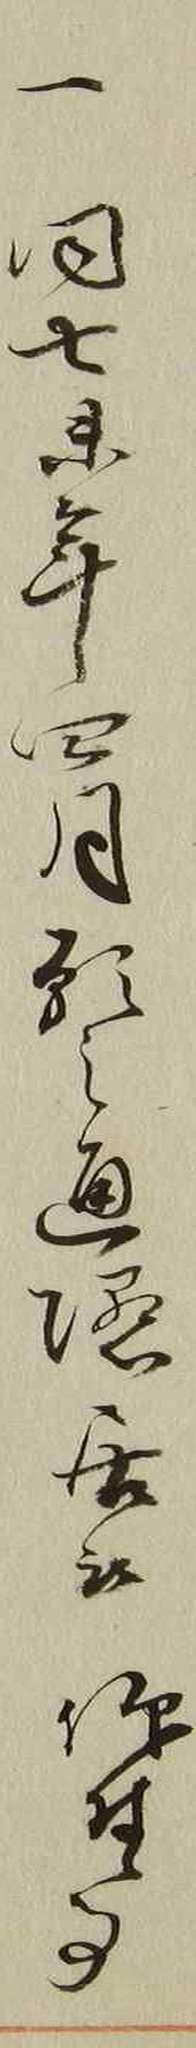一同七未年四月願之通隠居被仰付候事
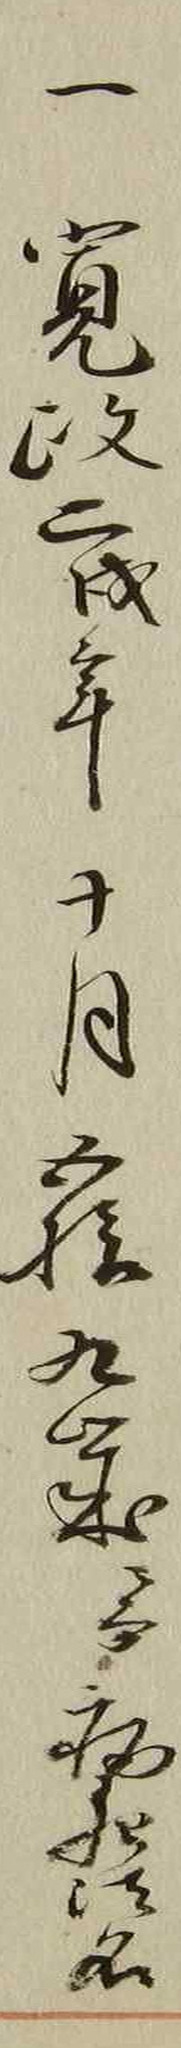一寛政二戌年十月五拾九歳ニ而病死法名
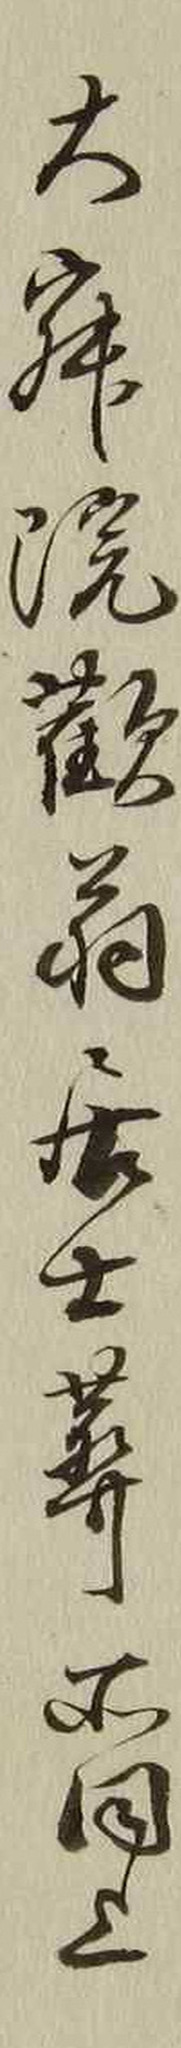大寝院歓翁居士葬所同上
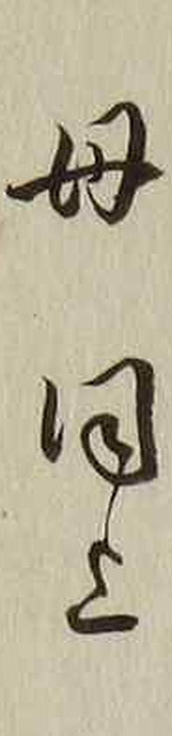母同上
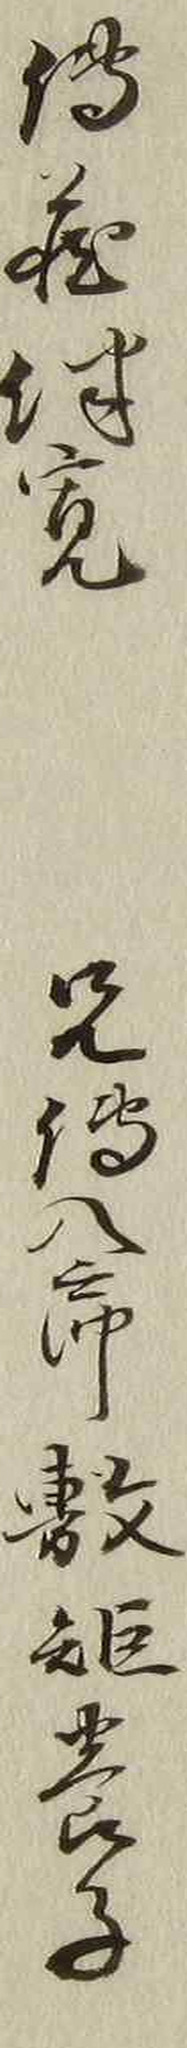伝蔵伴寛兄伝八郎敷矩養子
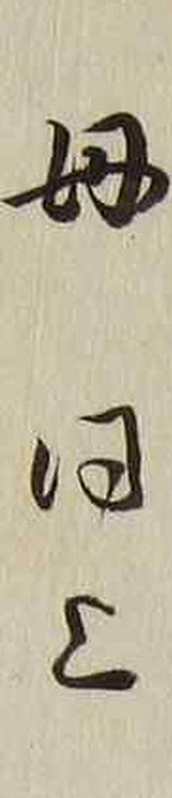母同上

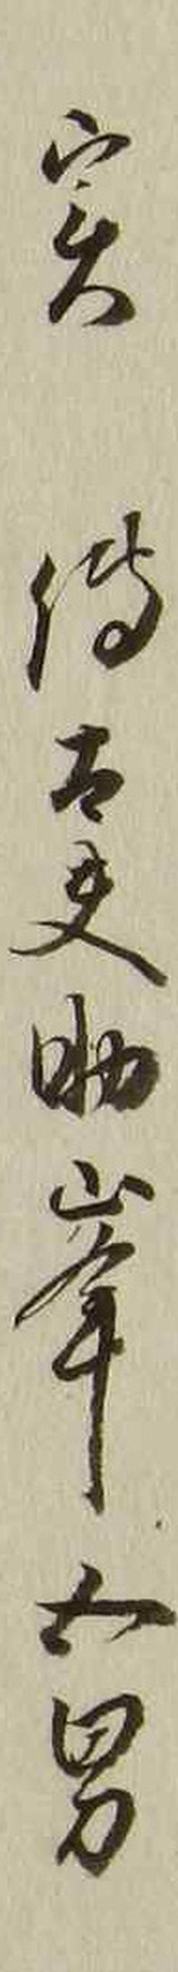実伝太夫助峰五男
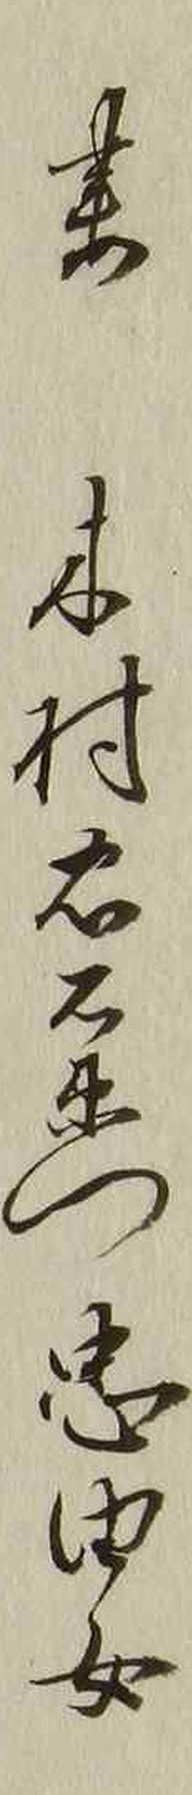妻木村右右衛門忠由女
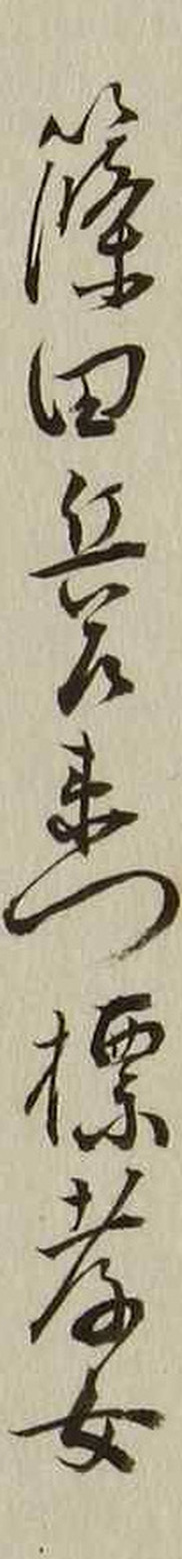篠田兵左衛門標孝女
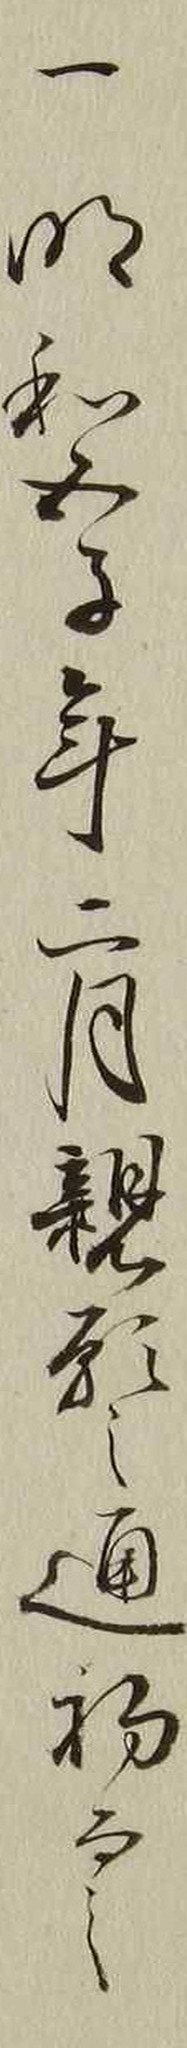一明和五子年二月親願之通初而之
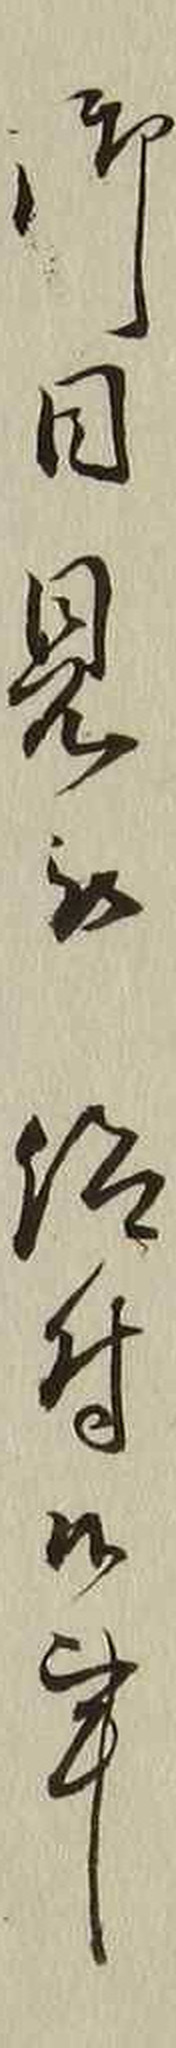御目見被仰付候事
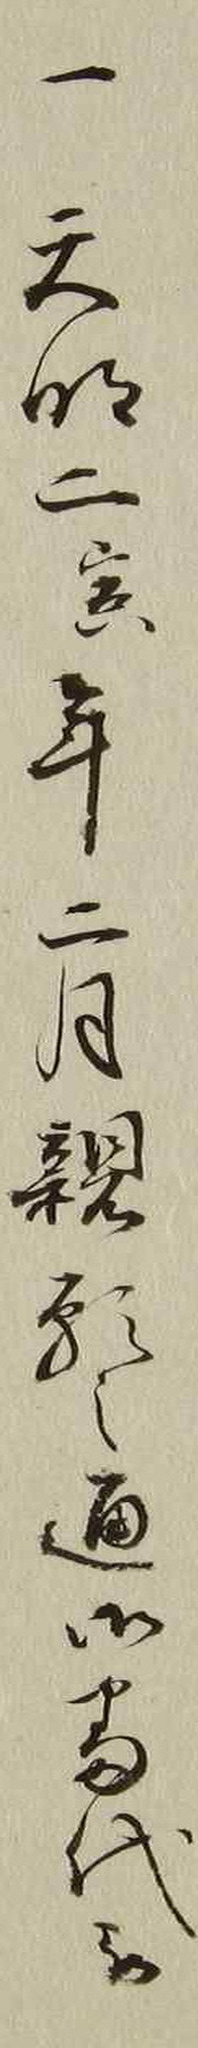一天明二寅年二月親願之通御番代被
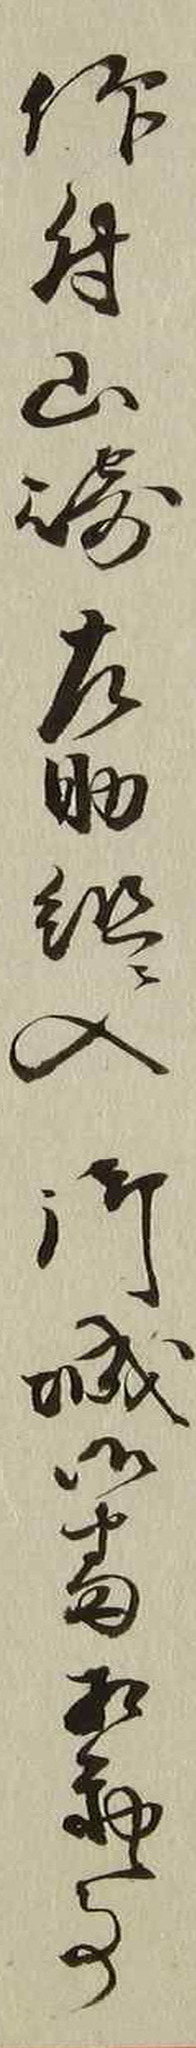仰付山崎左助組ニ入御城御番相勤候事
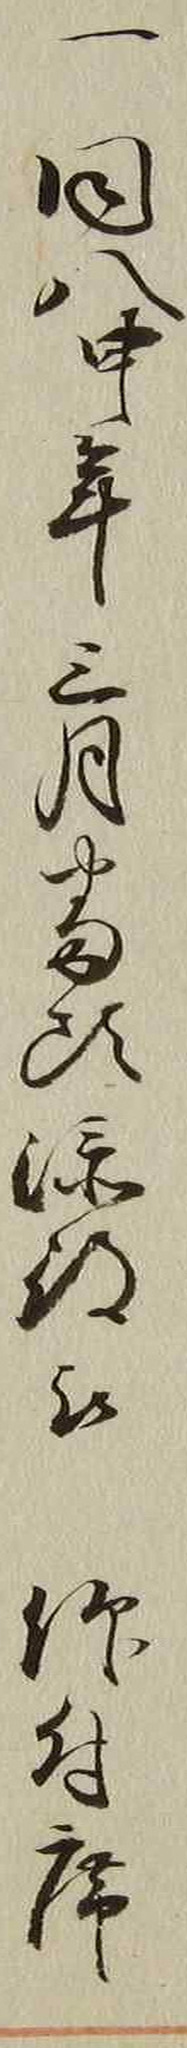一同八申年三月番頭添役被仰付席
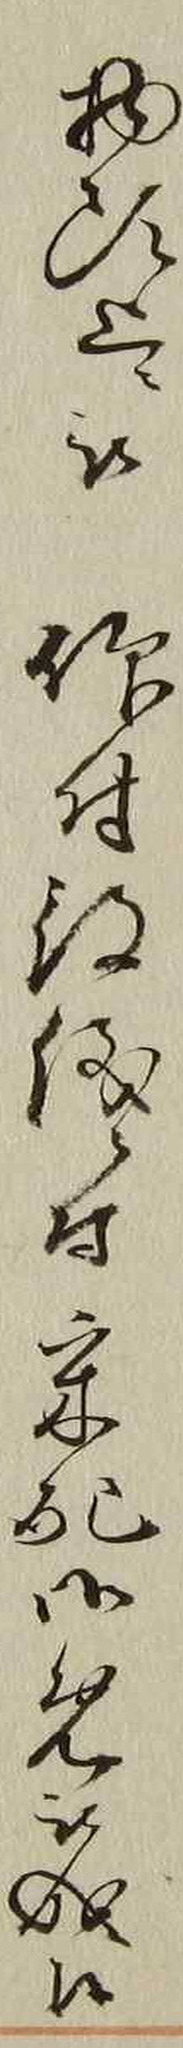物頭上ニ被仰付役儀ニ付采配御免被成候
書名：諸士系譜　巻之122　よ之部5
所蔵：会津若松市立会津図書館
